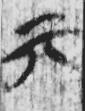亓（其）
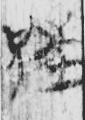○（兄）
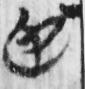臣
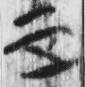正
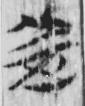義
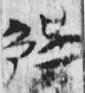強
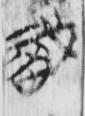戠
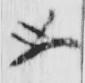之
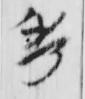秀
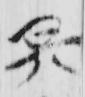○（期）
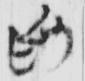爲
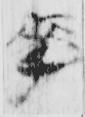李
